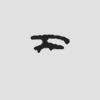于
